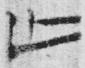亡（无）
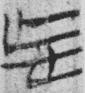忘
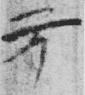元
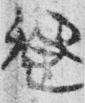卿（亨）
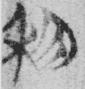利
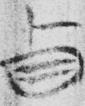貞
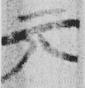亓（其）
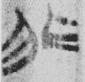非
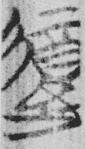○（復）
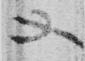又（有）
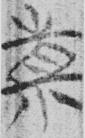○（眚）
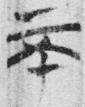不
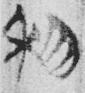利
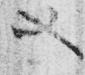又（有）
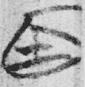○（攸）
